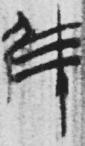隹（维）
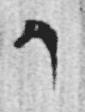人
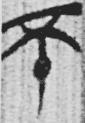不（丕）
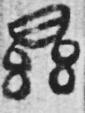○（顯）
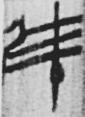隹（維）
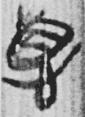惪（德）
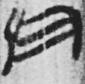於
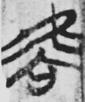唬（乎）
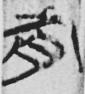前
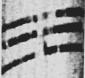王
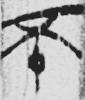不
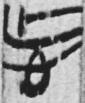忘
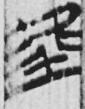○（吾）
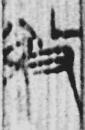敓（悅）
